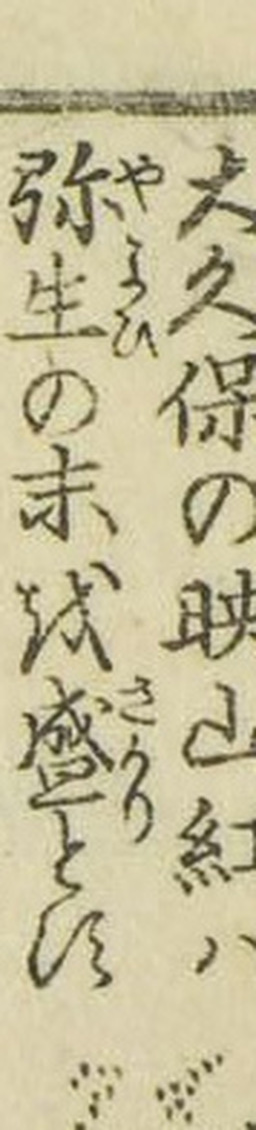弥生の末を盛とす
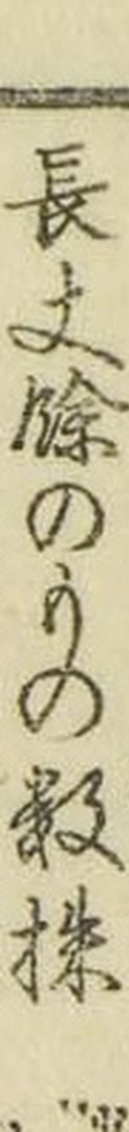長丈余のもの数株
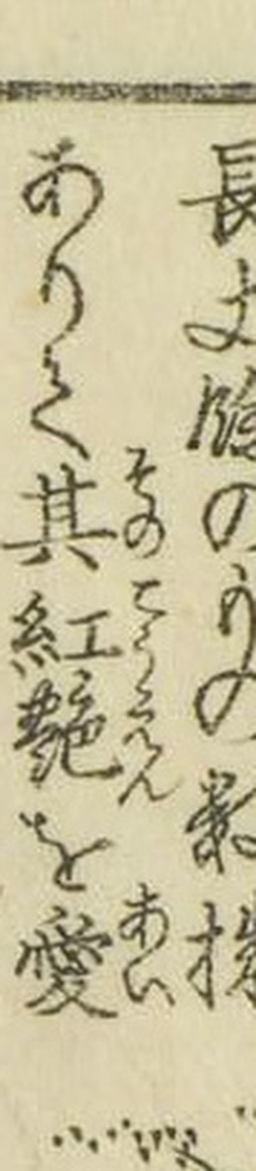ありて其紅艶を愛
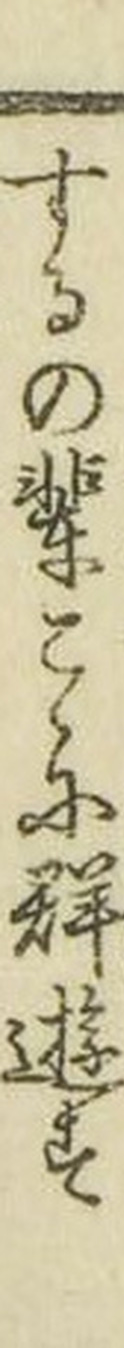するの輩こゝに群遊す
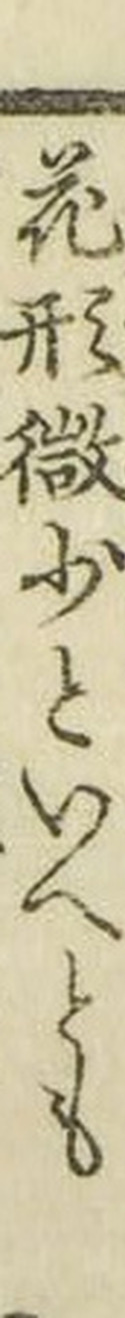花形微少といへとも
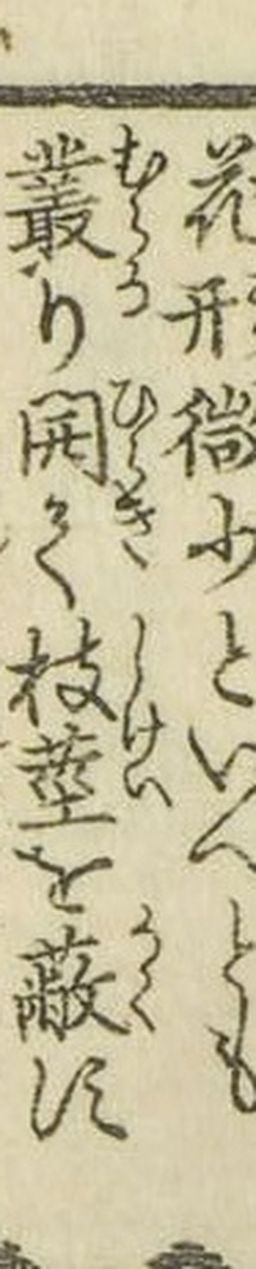叢り開て枝茎を蔽す
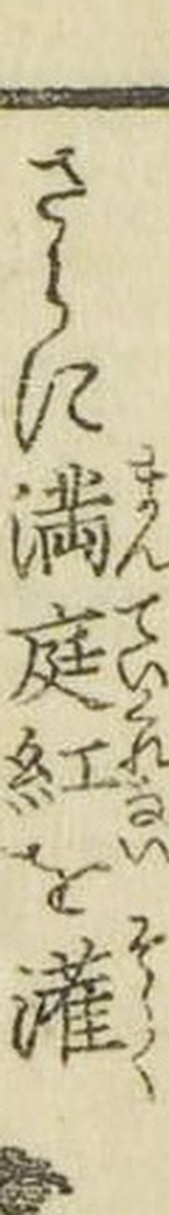さらに満庭紅を灌
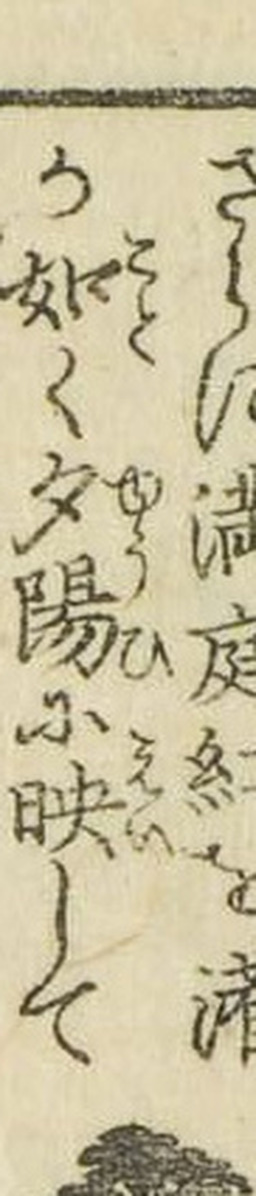か如く夕陽に映して
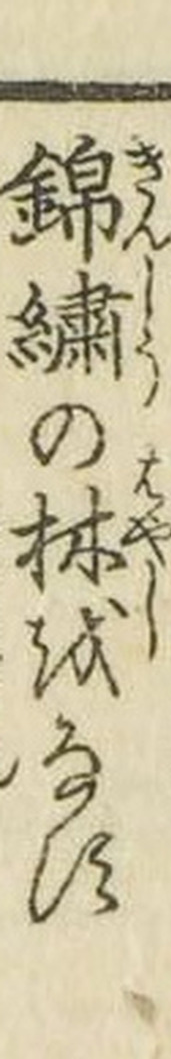錦繍の林をなす
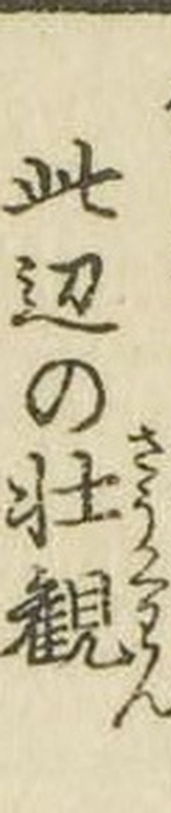此辺の壮観
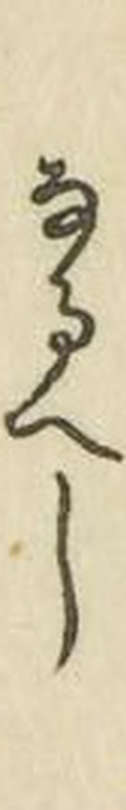なるへし

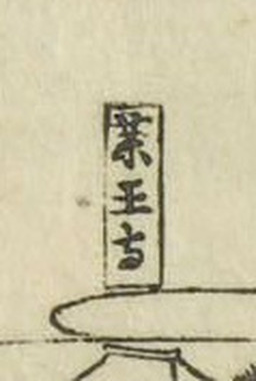薬王寺
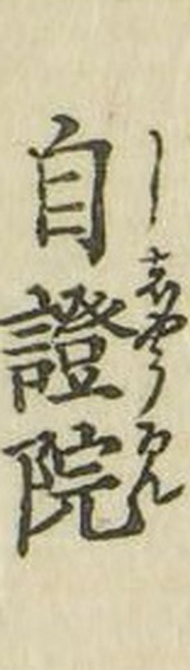自証院

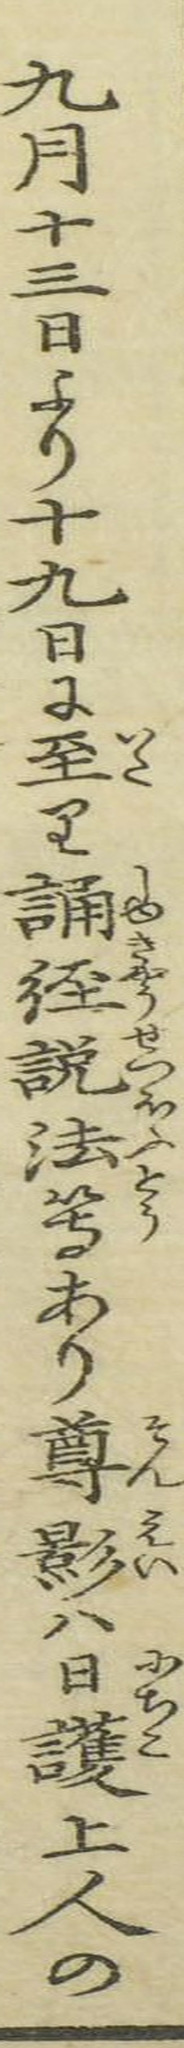九月十三日より十九日に至り誦経説法等あり尊影は日護上人の
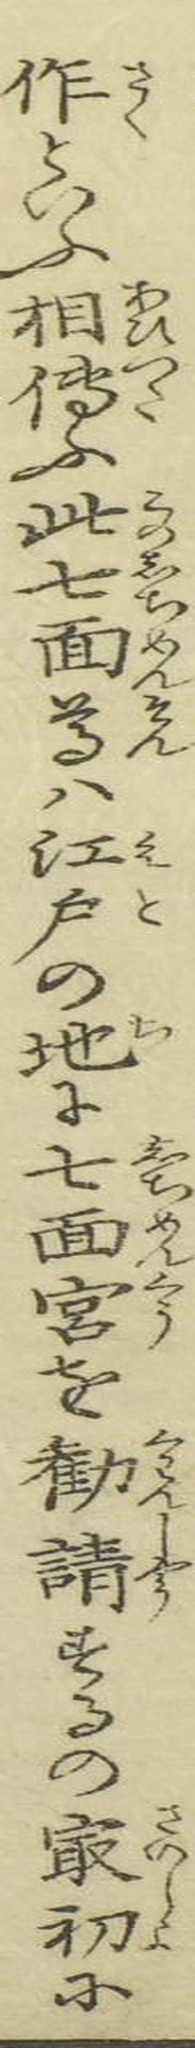作といふ相伝ふ此七面尊は江戸の地に七面宮を勧請するの最初に
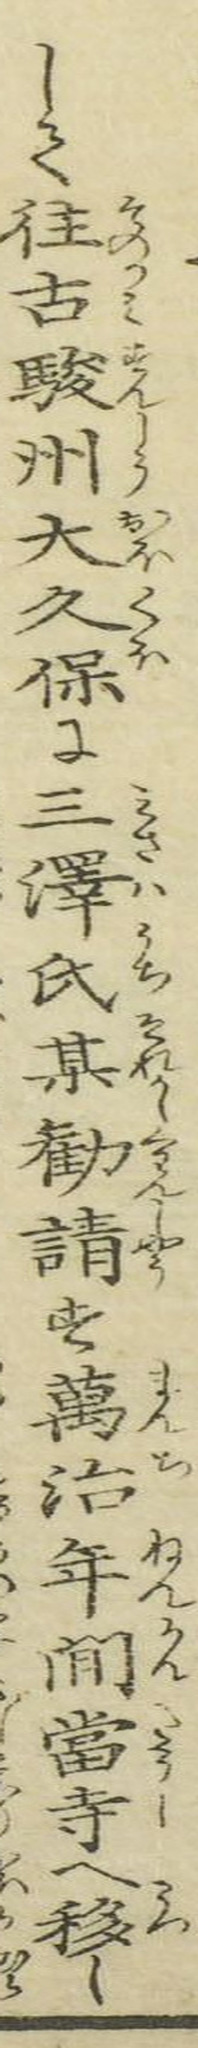して往古駿州大久保に三沢氏某勧請す萬治年間当寺へ移し
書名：江戸名所図会 20巻 巻之11
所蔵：東京学芸大学教育コンテンツアーカイブ
